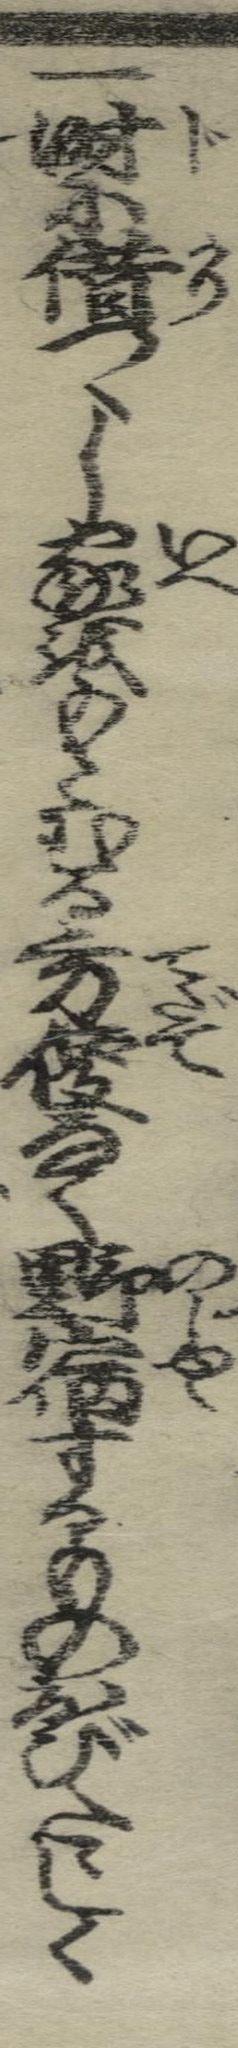一時に借つくし家をもとむる方便なく野宿するものおびたゞしく
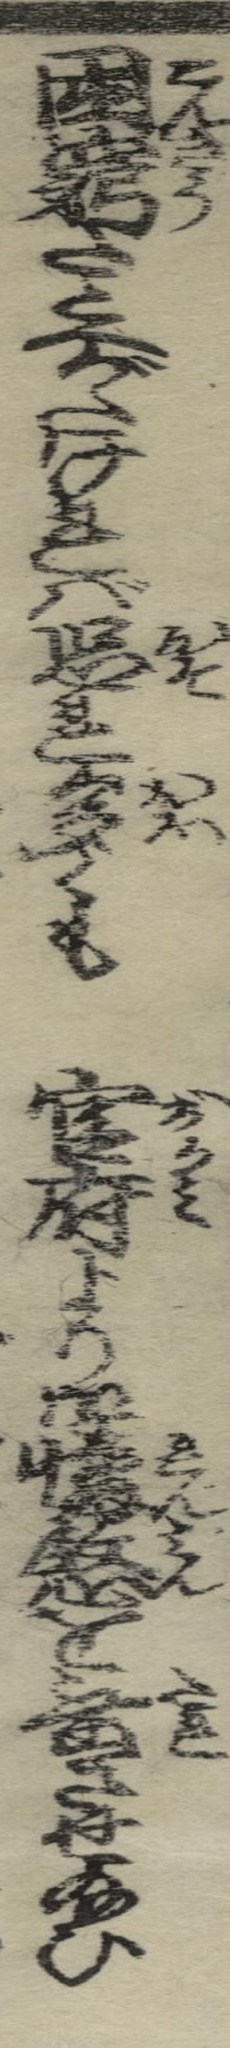困窮たとへがたければ恐れ多くも官府より御憐憫を垂させ給ひ
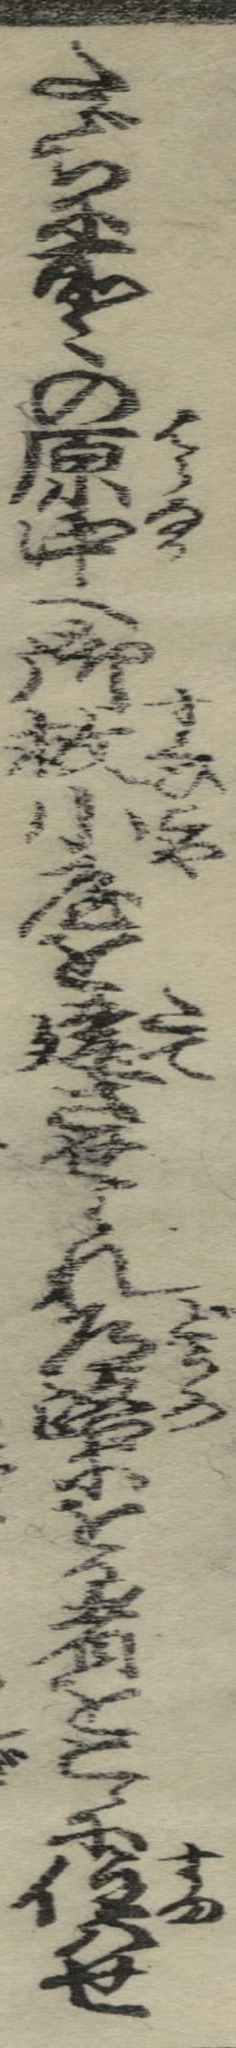たゞちに所々の原中へ御救小屋を建させられ道路等をる者をこゝに住はせ
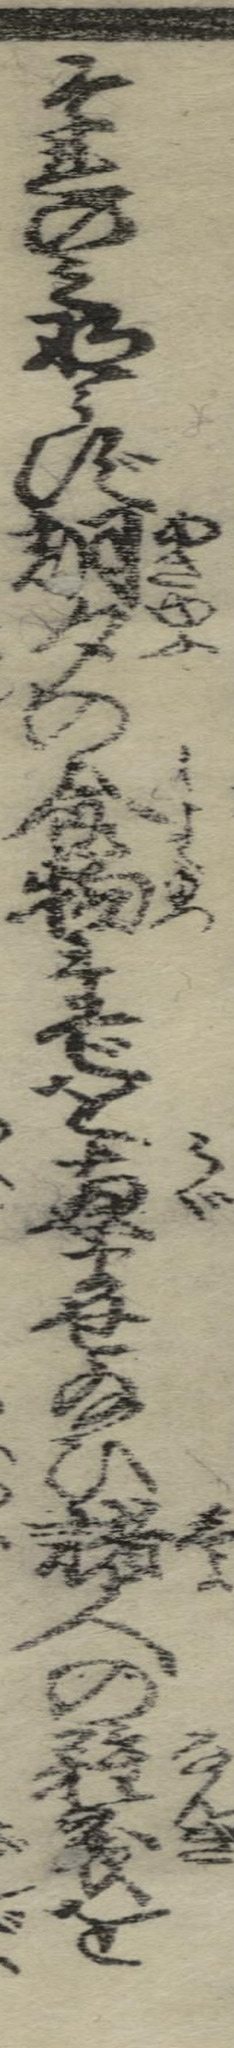それのみならず朝夕の食物までを兩ませ給ひ諸人の難義を
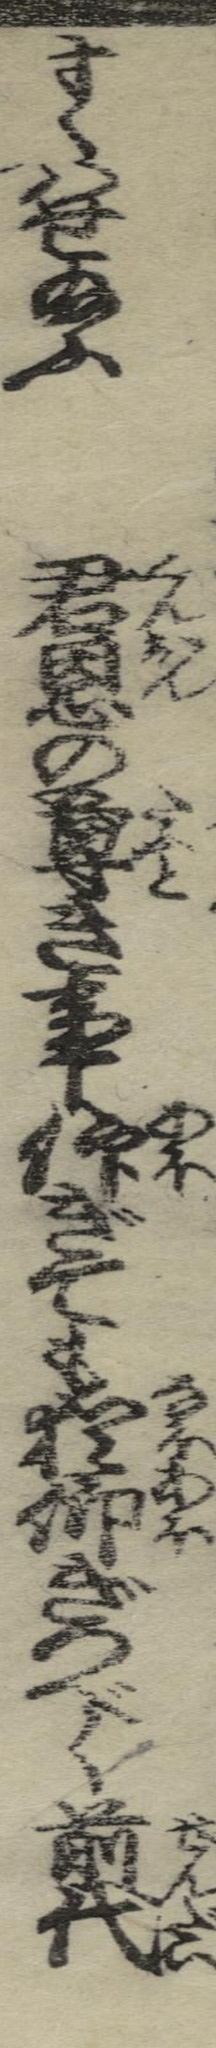すくはせ給ふ君恩の尊き事仰ぎても猶仰ぎつべく前代
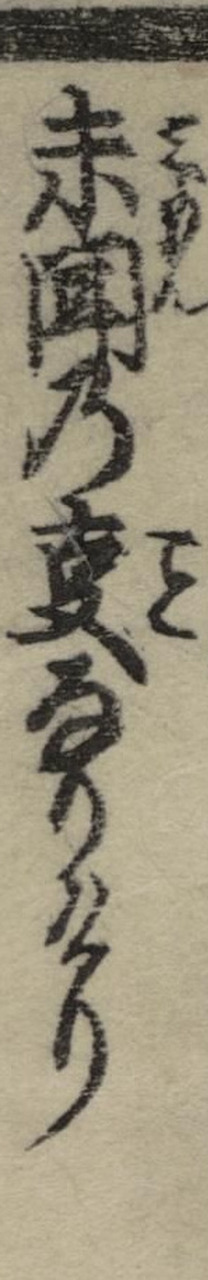未聞の事なりけり
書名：[文政十二年三月の江戸大火に関する瓦版]
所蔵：東京大学地震研究所図書室 Earthquake Research Institute Library, The University of Tokyo, JAPAN
